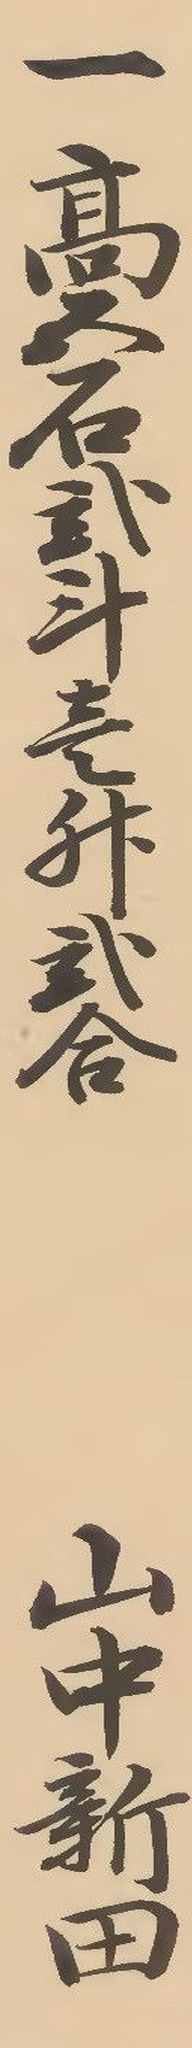一高五石弐斗壱升弐合山中新田
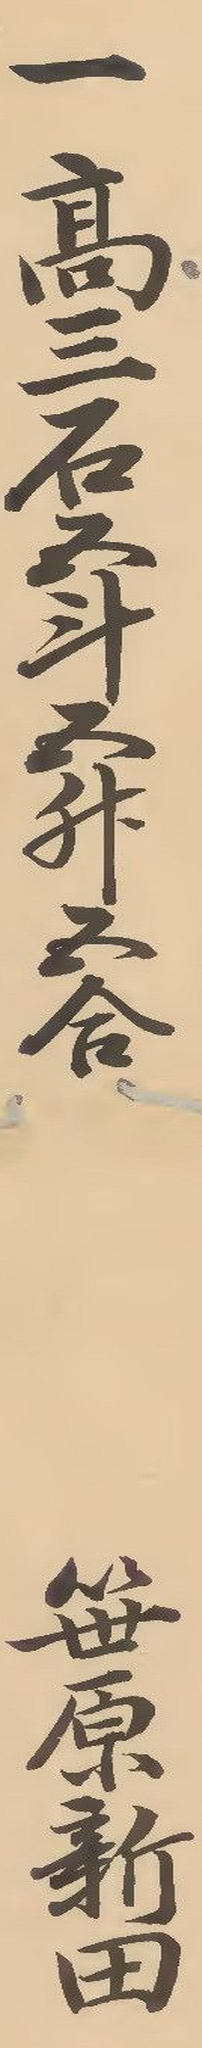一高三石五斗五升五合笹原新田

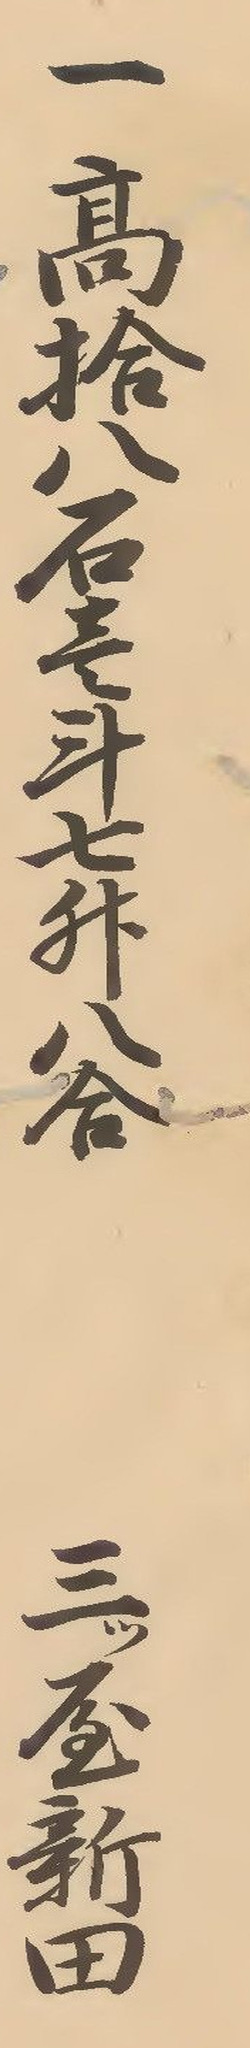一高拾八石壱斗七升八合三ツ屋新田
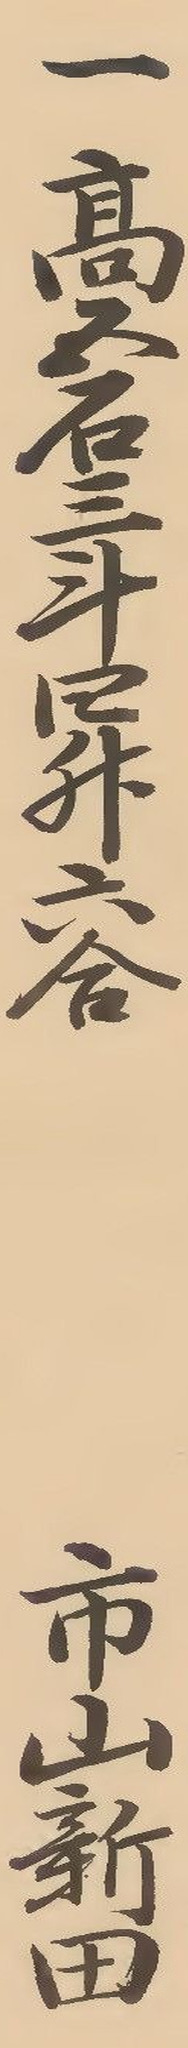一高五石三斗四升六合市山新田
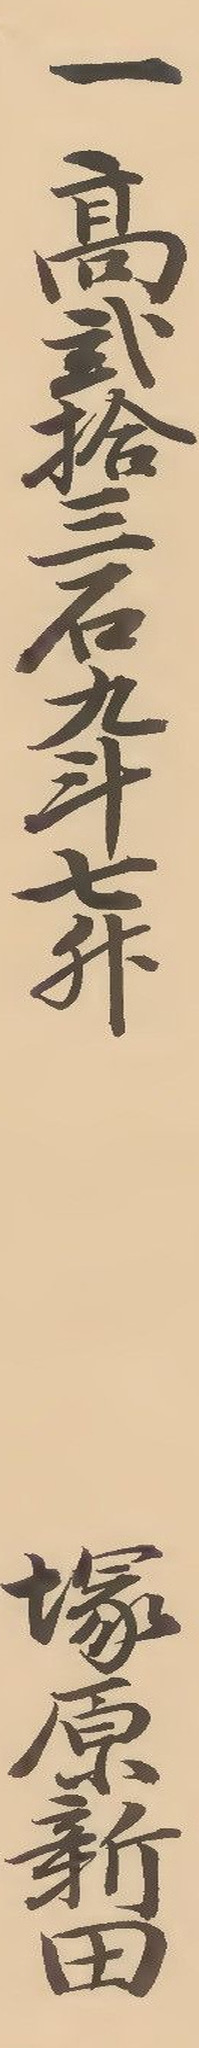一高弐拾三石九斗七升塚原新田
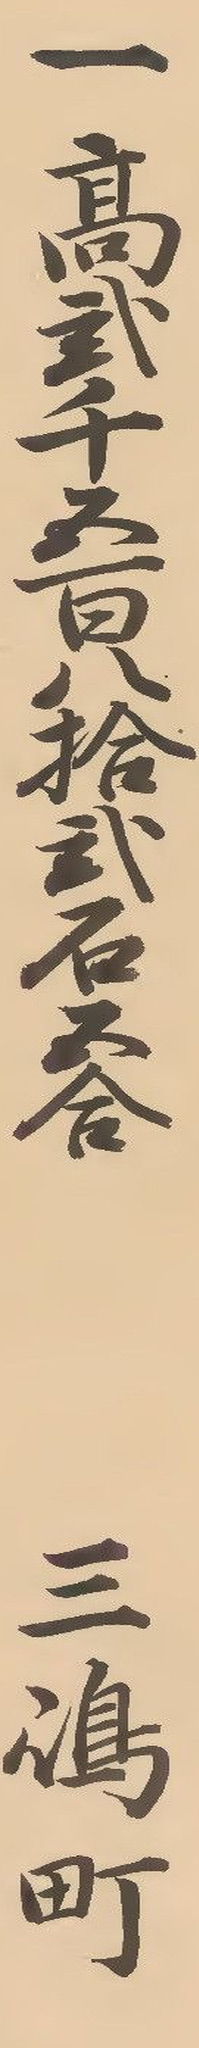一高弐千五百八拾弐石五合三島町
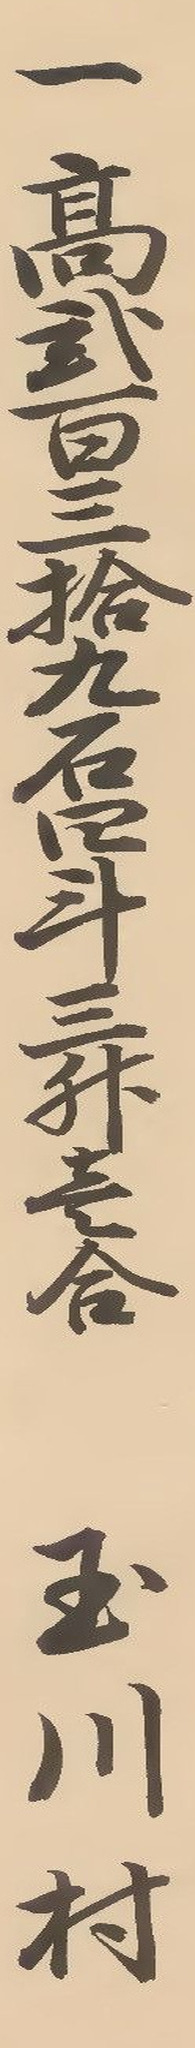一高弐百三拾九石四斗三升七合玉川村
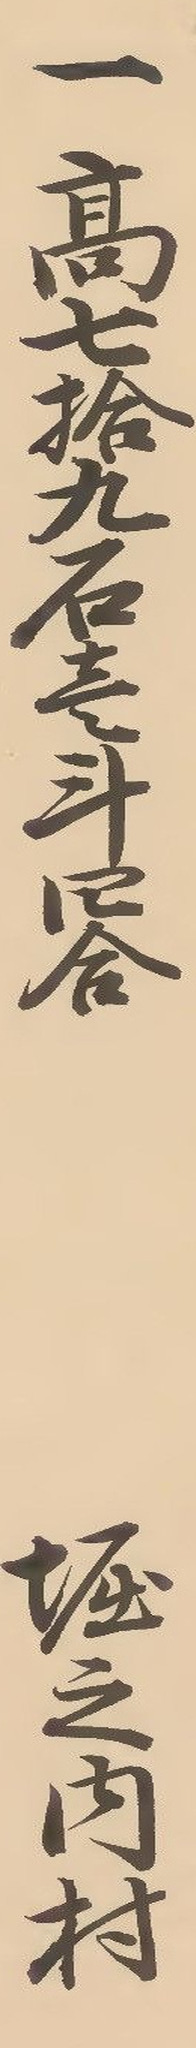一高七拾九石壱斗四合堀之内村
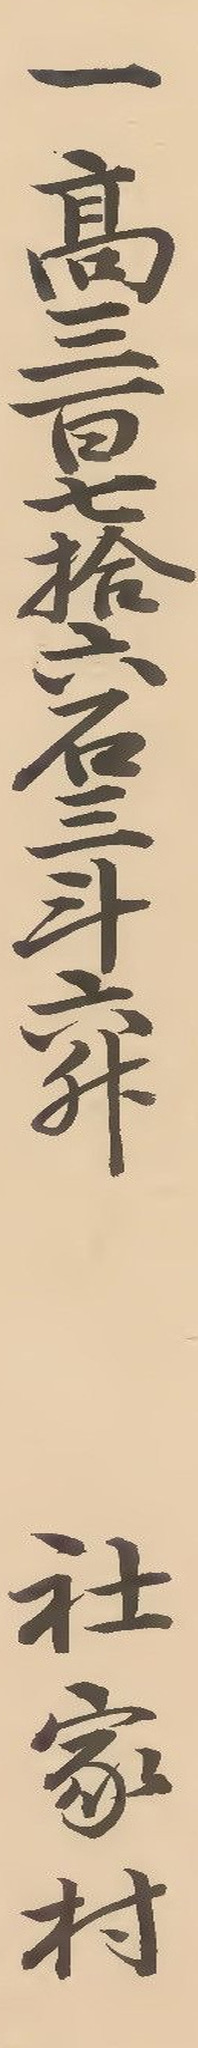一高三百七拾六石三斗六升社家村
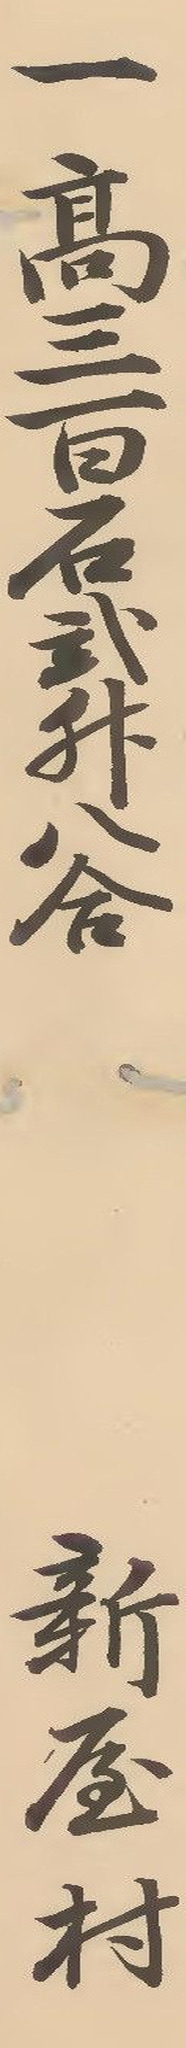一高三百石弐升八合新屋村

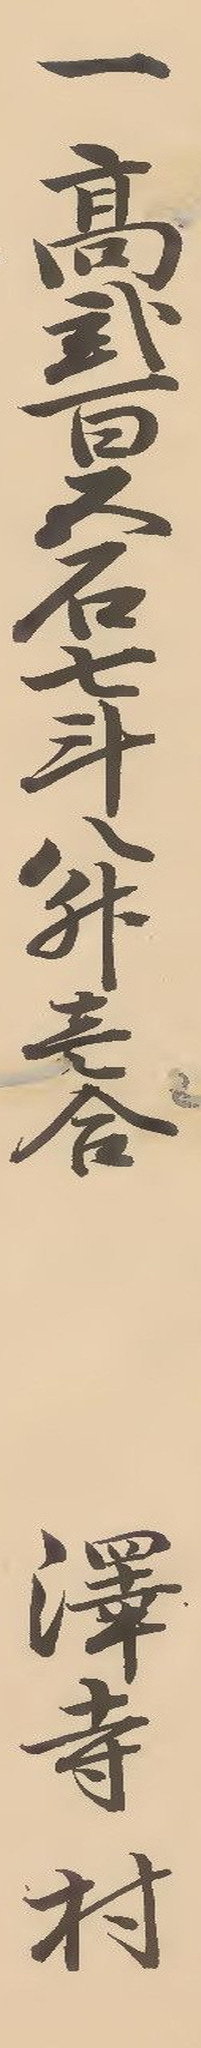一高弐百五石七斗八升壱合沢寺村
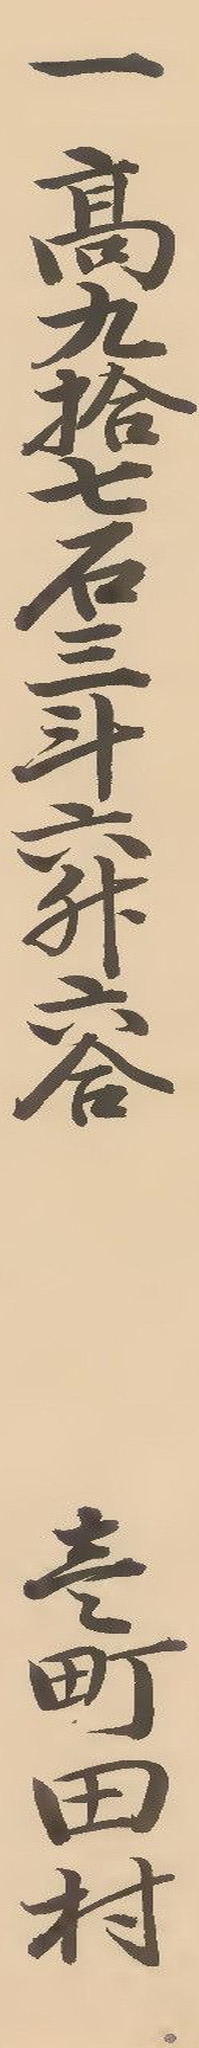一高九拾七石三斗六升六合壱町田村
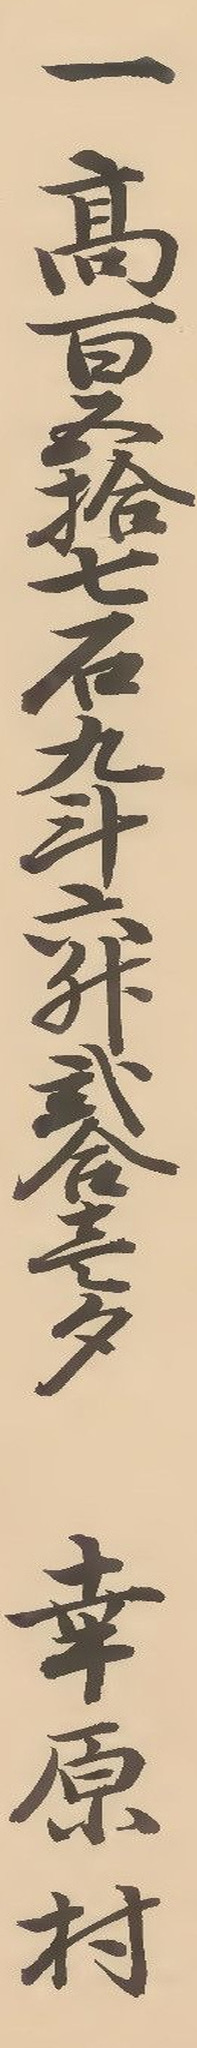一高百五拾七石九斗六升弐合壱勺幸原村
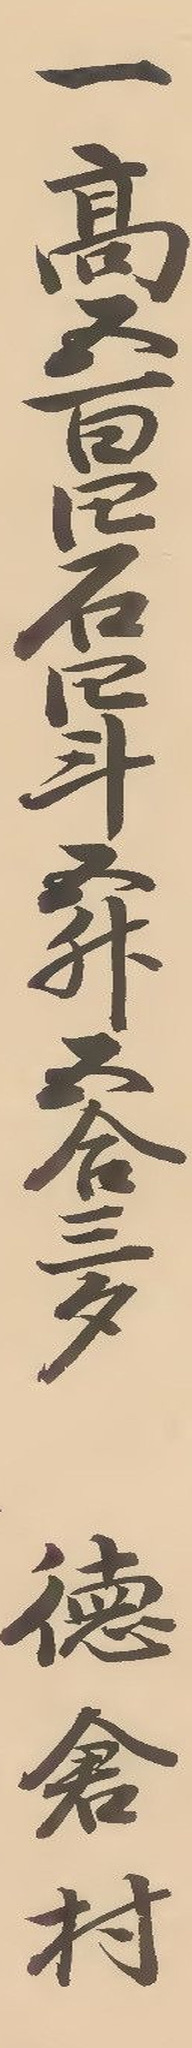一高五百四石四斗五升五合三勺徳倉村
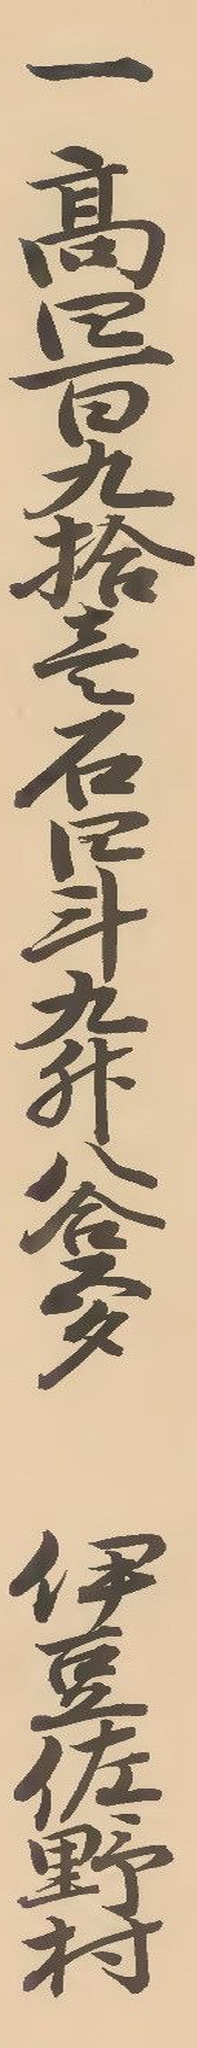一高四百九拾壱石四斗九升八合五勺伊豆佐野村
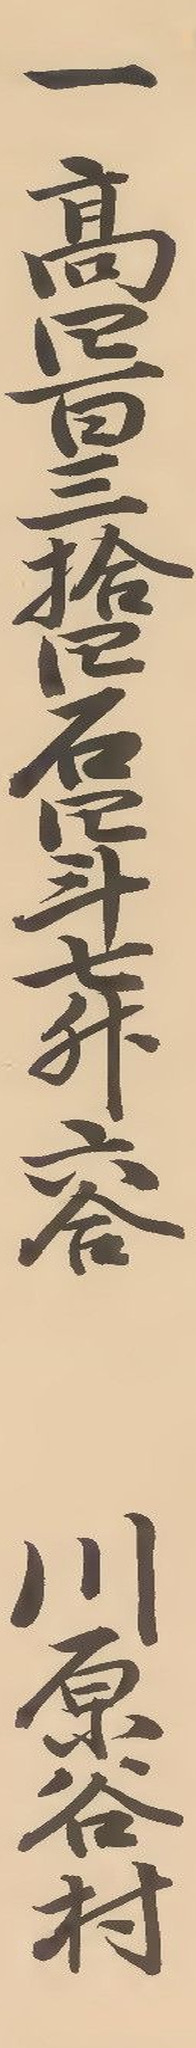一高四百三拾四石四斗七升六合川原谷村
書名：伊豆国郷帳
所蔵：国立公文書館 National Archives of Japan
